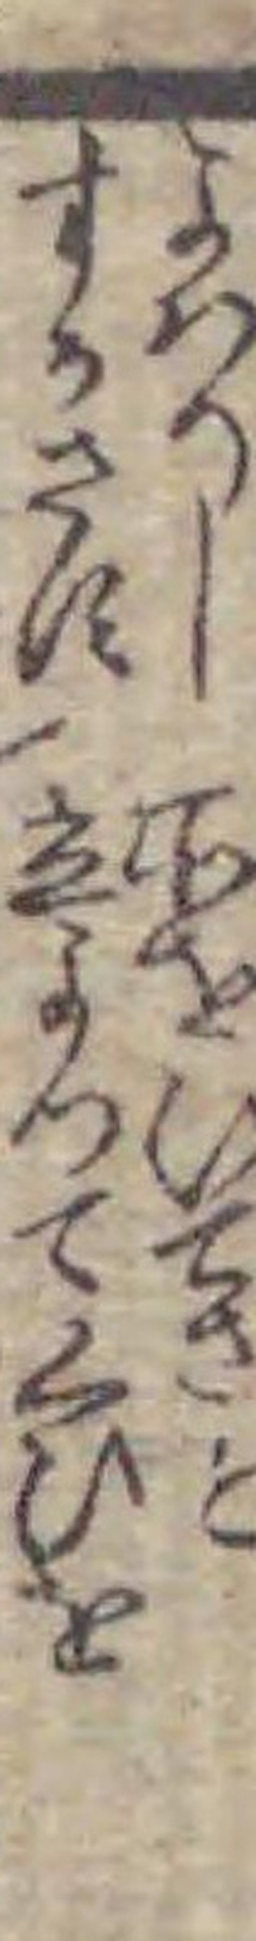すかさす立ちよつてくひを
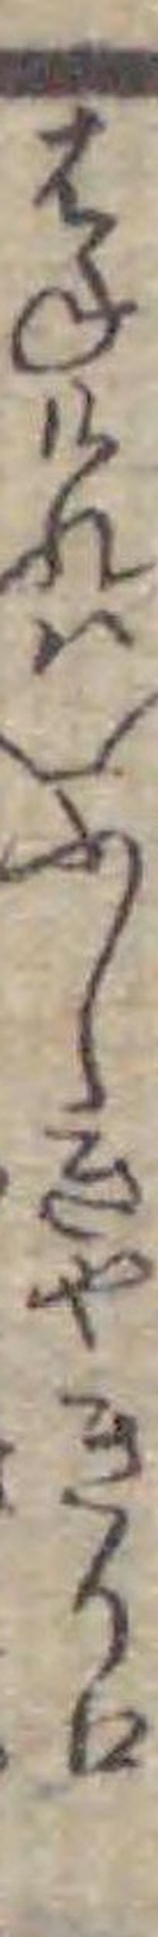はねけれはふしきやきり口
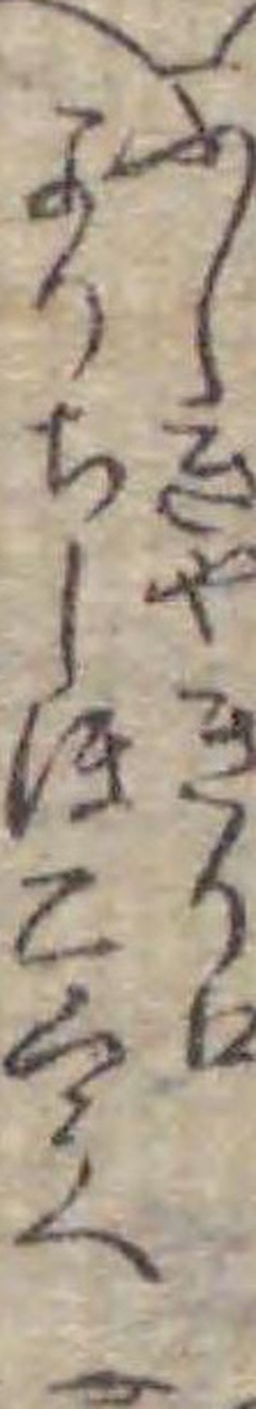よりちしほこくうへ
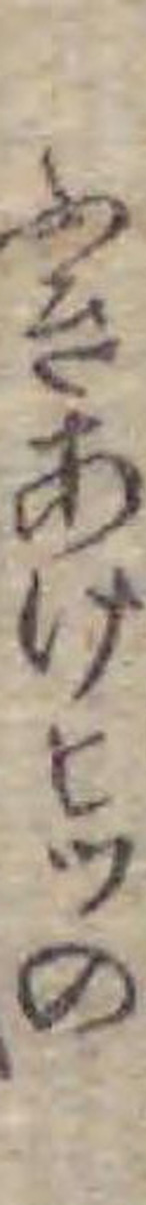ふきあけ七つの
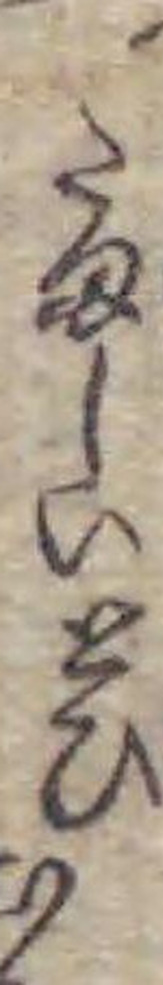たましいとひ
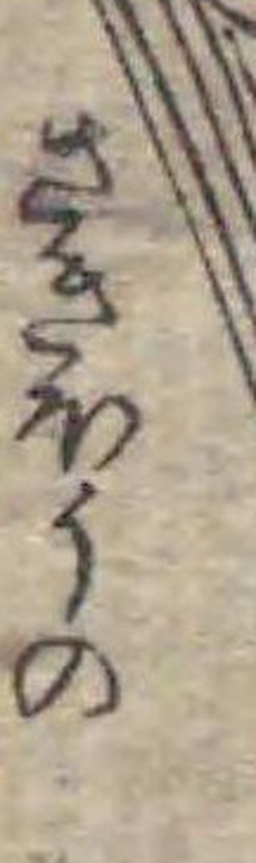さきほうの
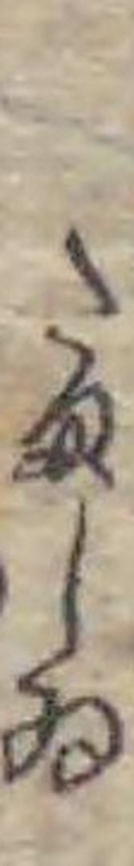たましゐ
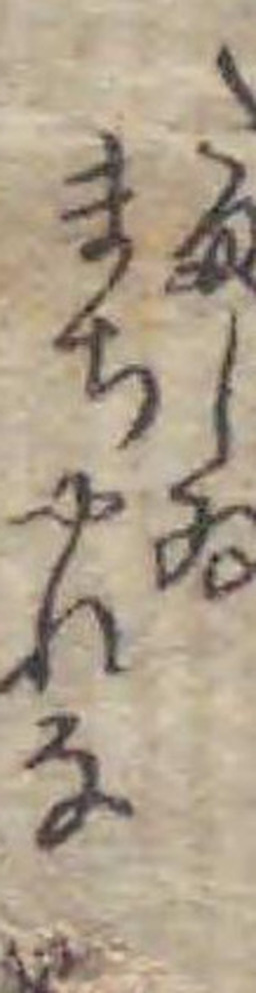まちやれな
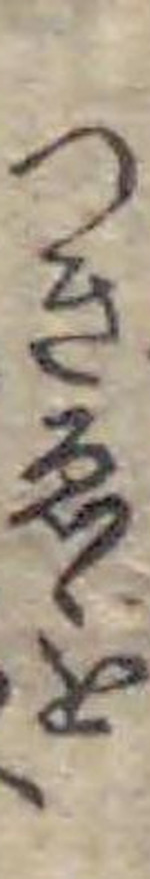つきゑゝを
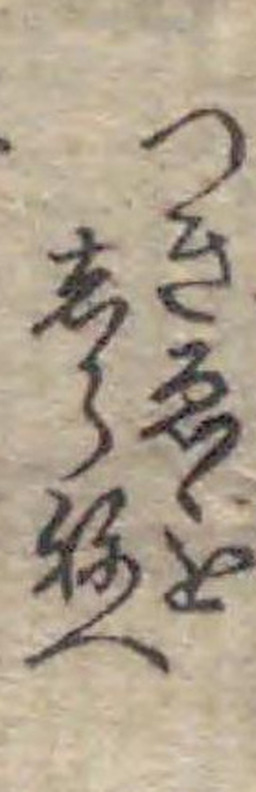しらねへ
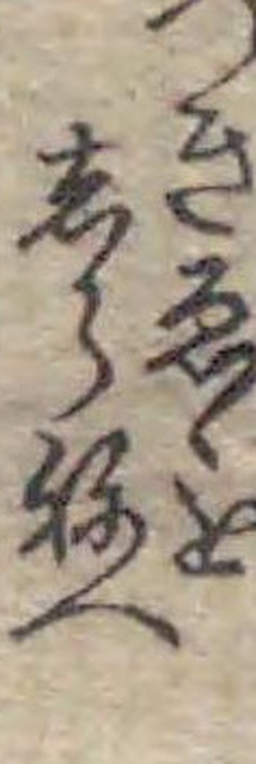しらねへ
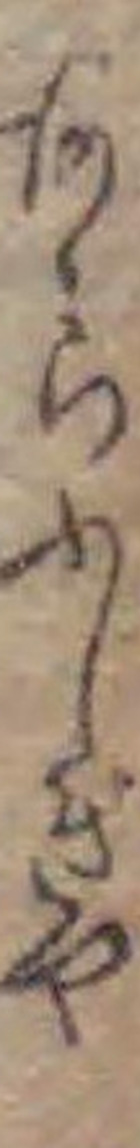あゝらふしぎや
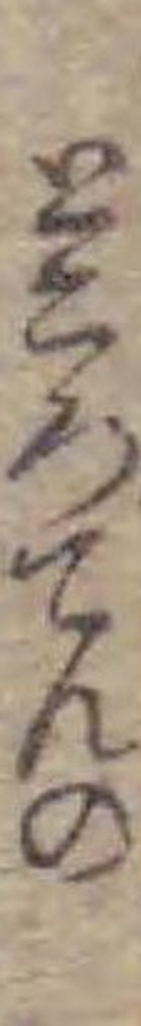ところてんの
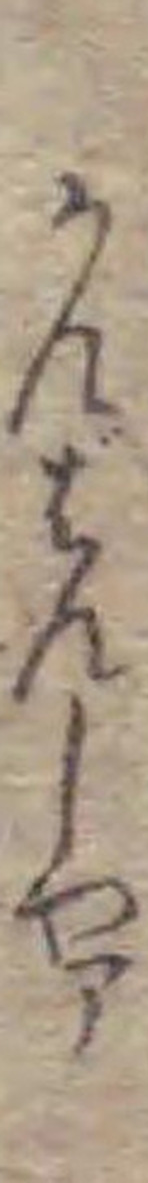かんばんしやァ
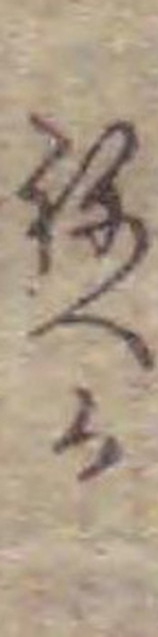ねへか
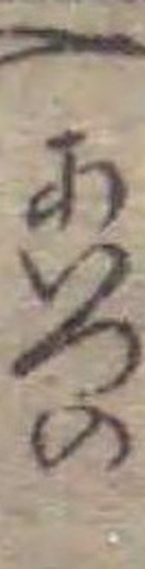あいつの
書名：時代世話二挺皷 : 2巻
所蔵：国立国会図書館 National Diet Library, JAPAN
